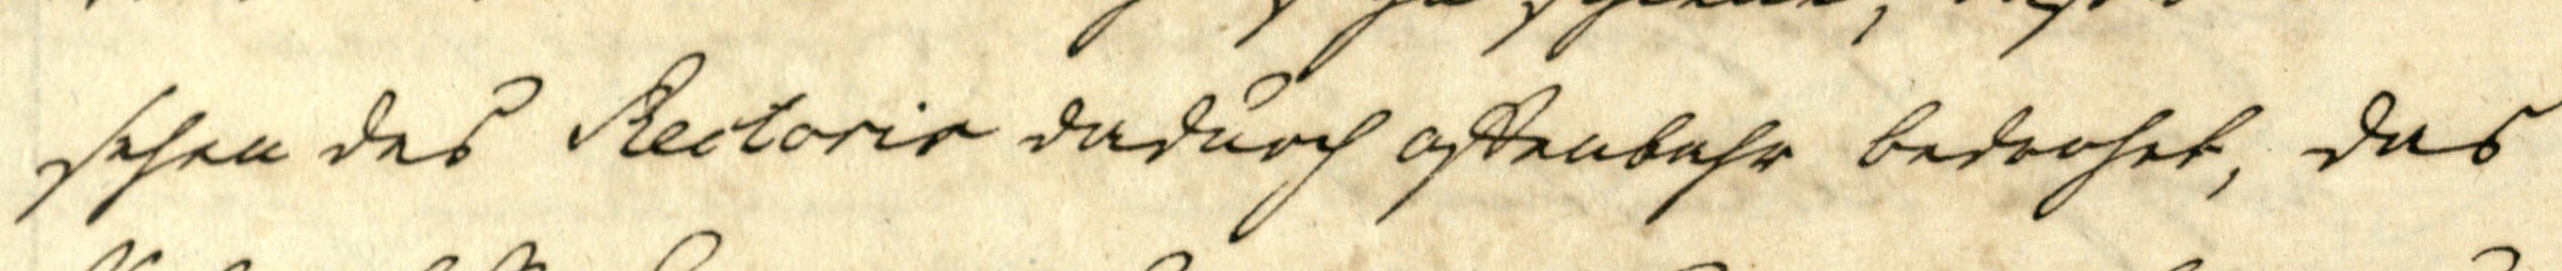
sehen des Rectoris dadurch offenbahr bedrohet, das
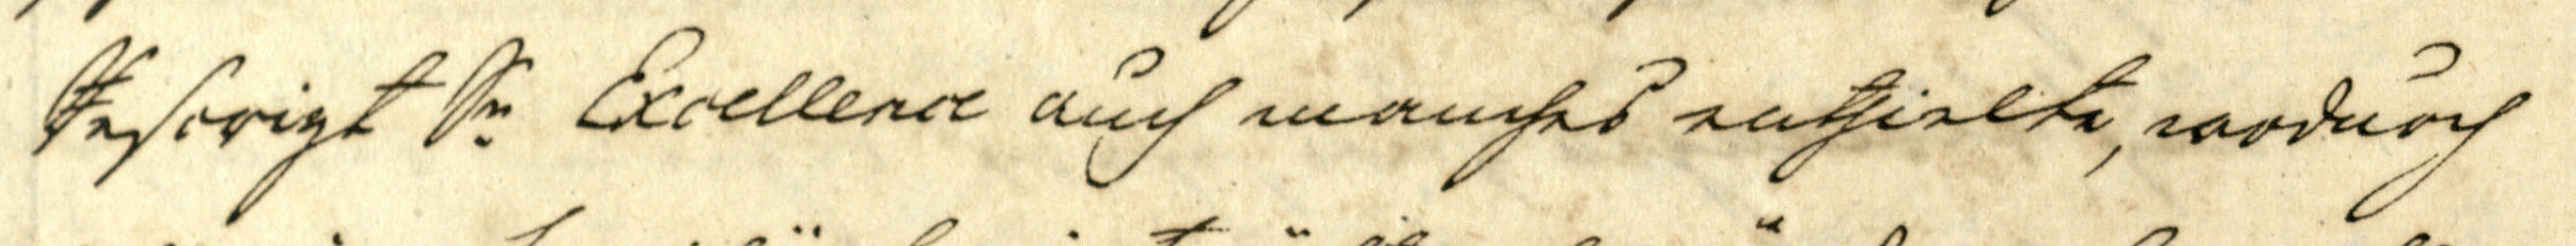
Rescript Sr Excellence auch manches enthielte, wodurch
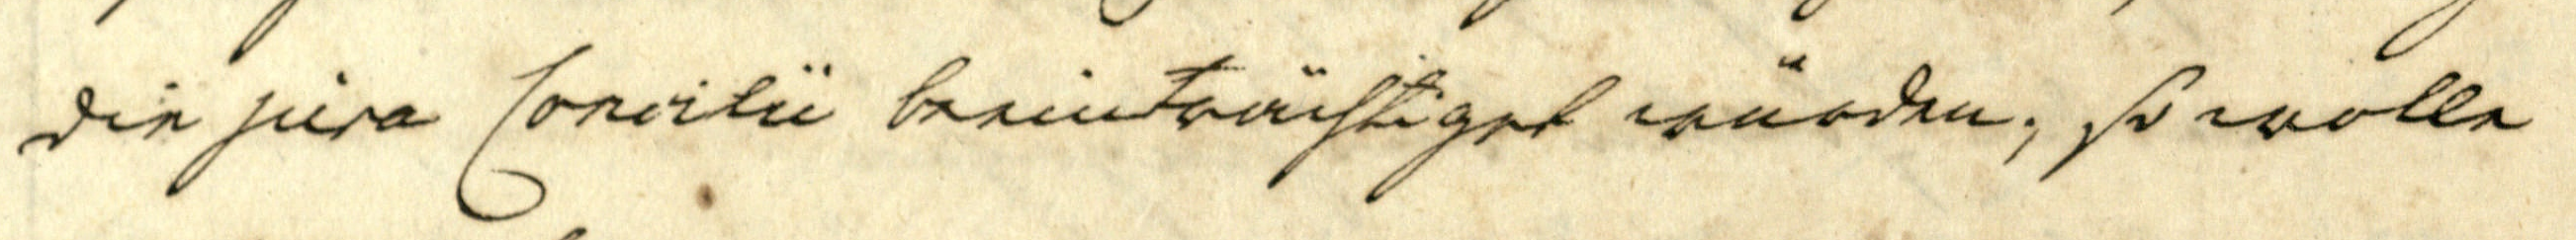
die jura Concilii beeinträchtiget würden; so wolle
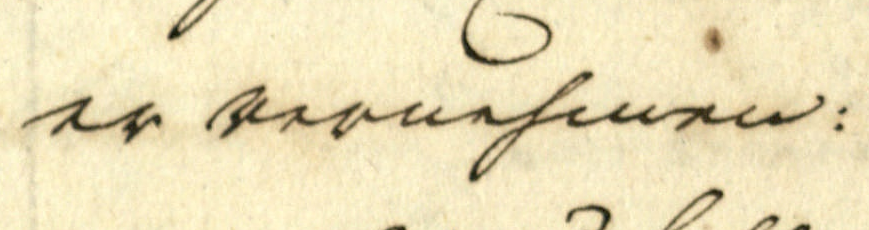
er vernehmen:
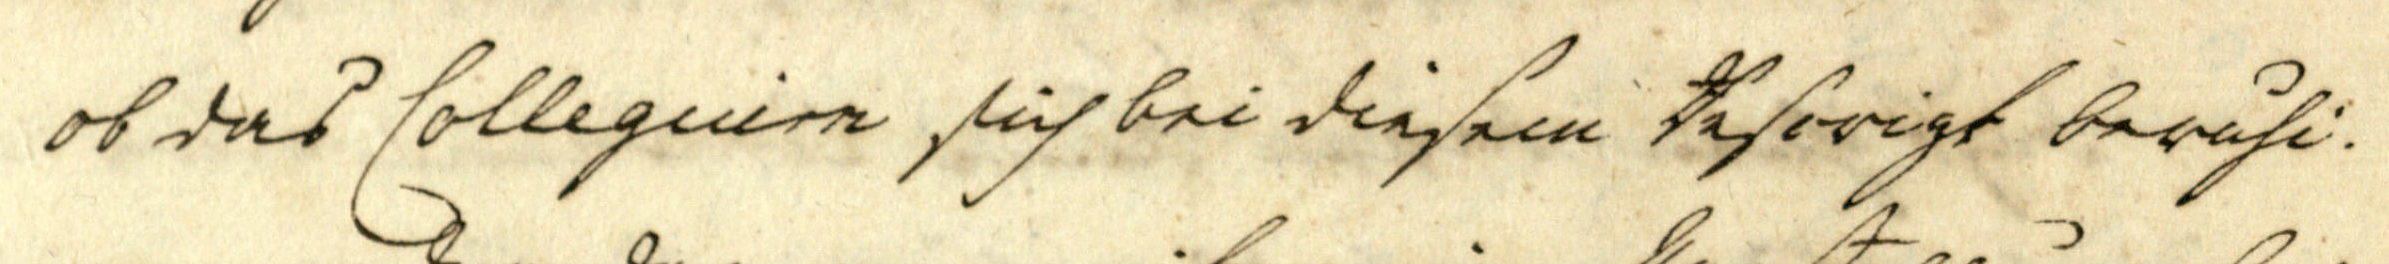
ob das Collegium sich bei diesem Rescript beruhi¬
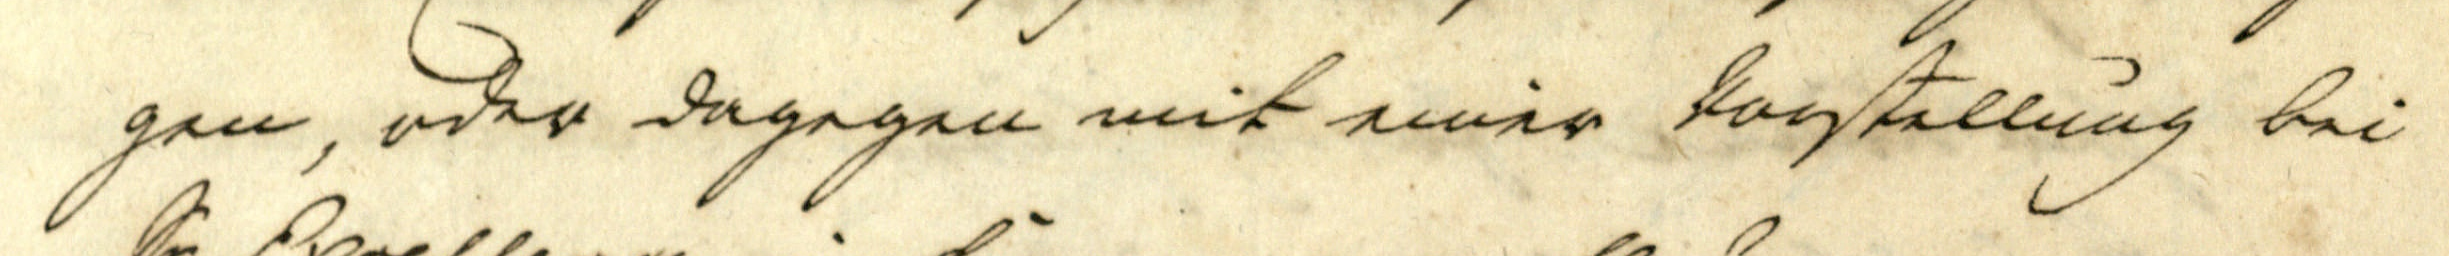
gen, oder dagegen mit einer Vorstellung bei
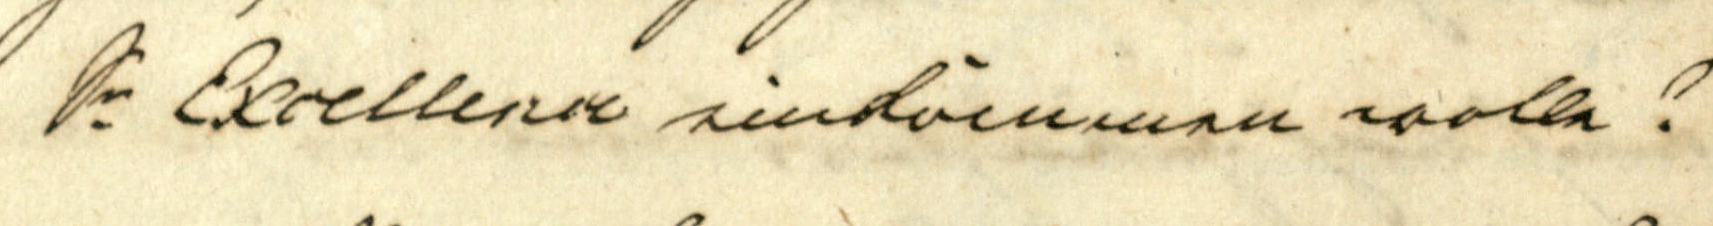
Sr. Excellence einkommen wolle?
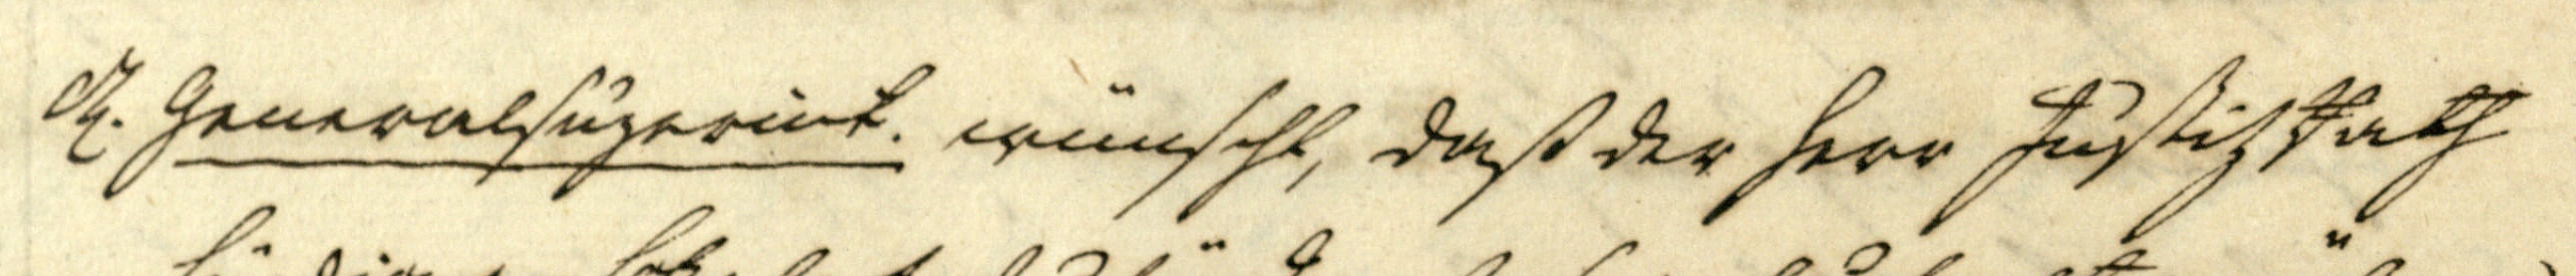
dh. Generalsuperint. wünscht, daß der Herr JustizRath
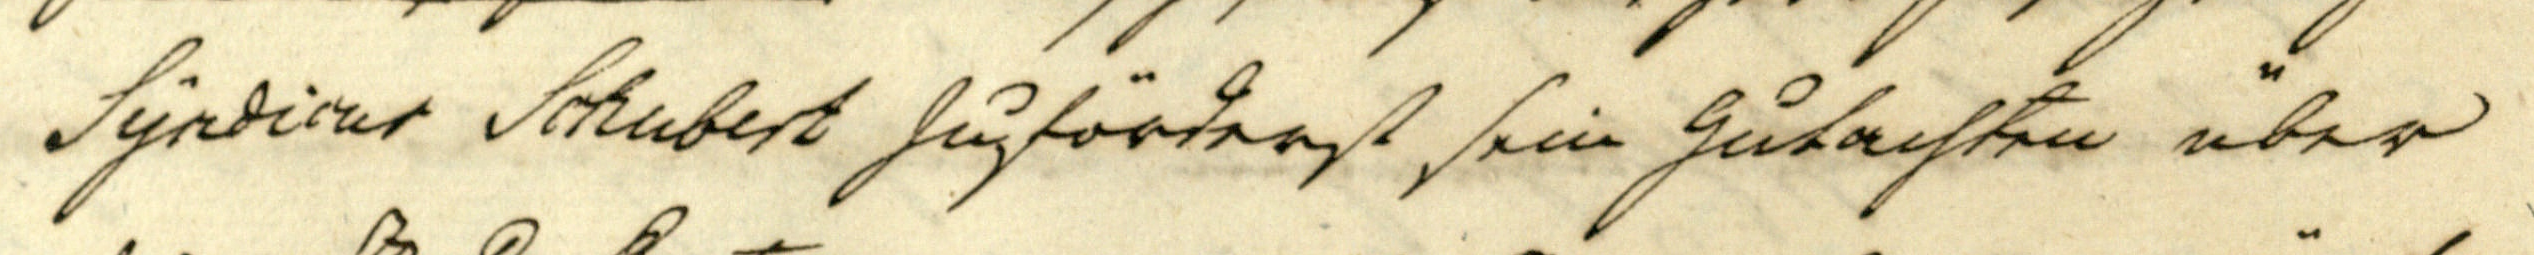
Sÿndicus Schubert zuförderst sein Gutachten über
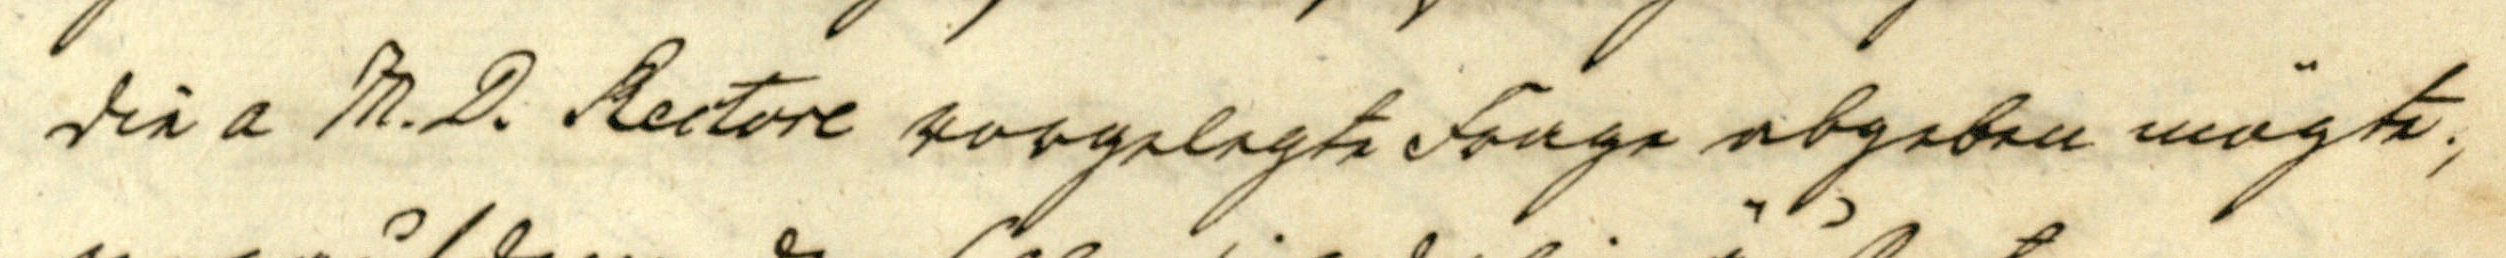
die a M. D. Rectore vorgelegte Frage abgeben mögte;
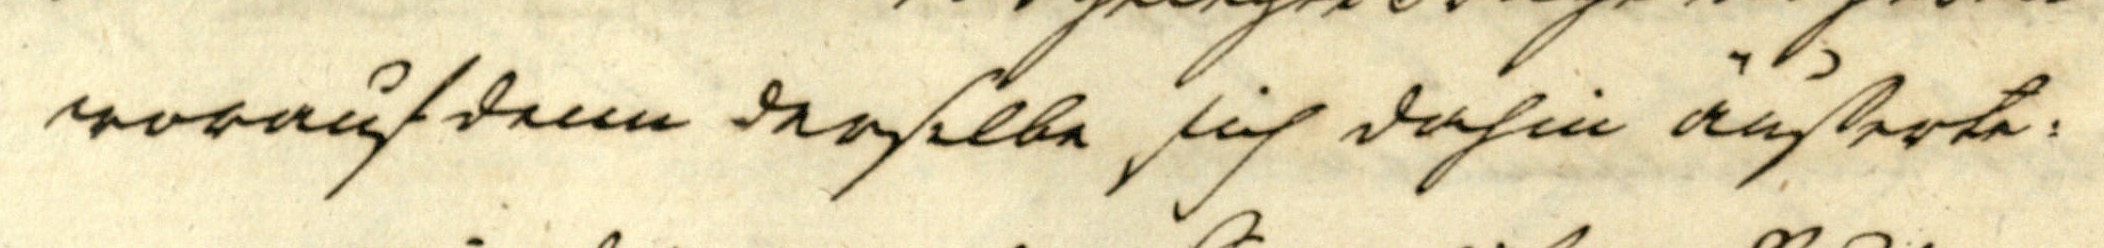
worauf denn derselbe sich dahin äusserte:
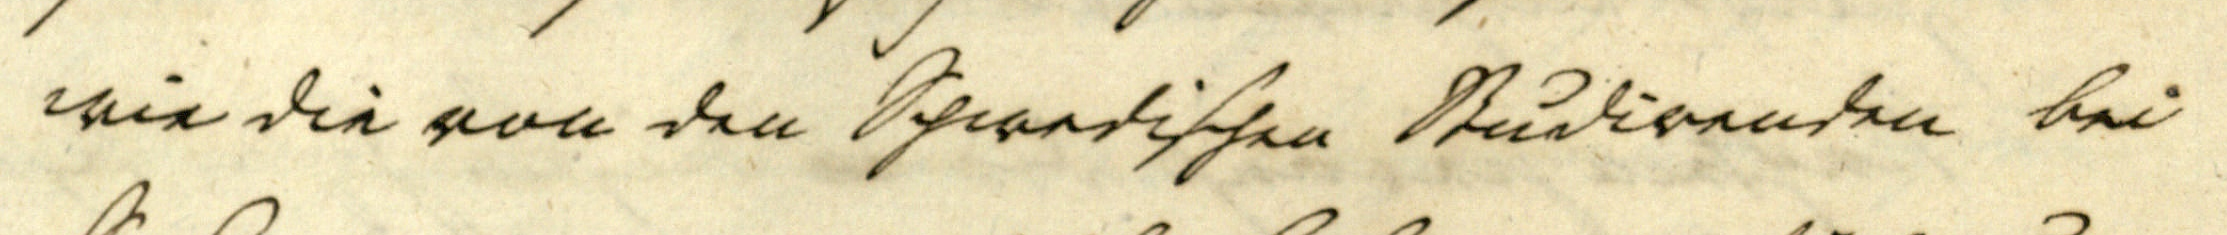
wie die von den Schwedischen Studirenden bei
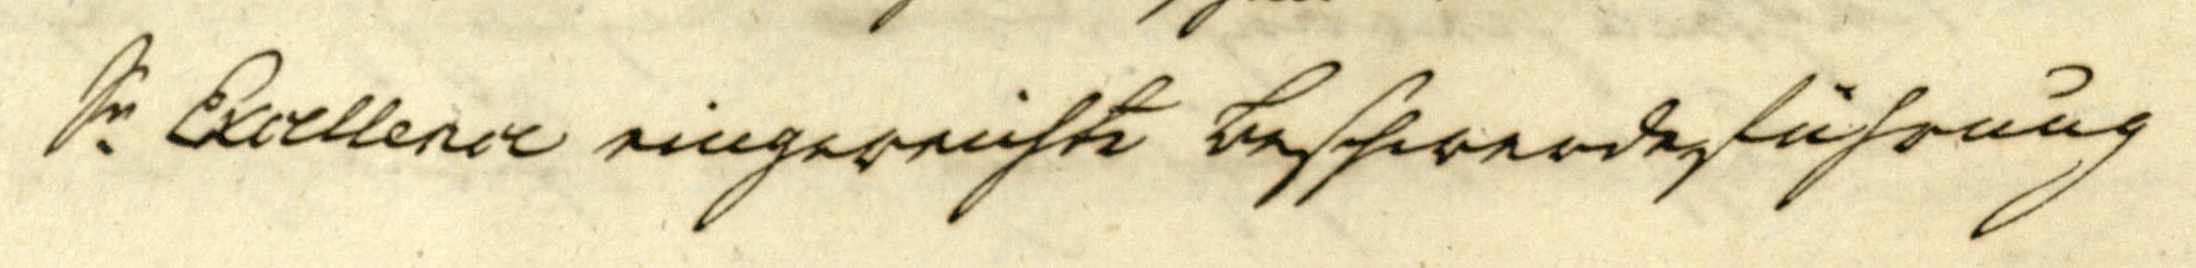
Sr Excellence eingereichte Beschwerdeführung
